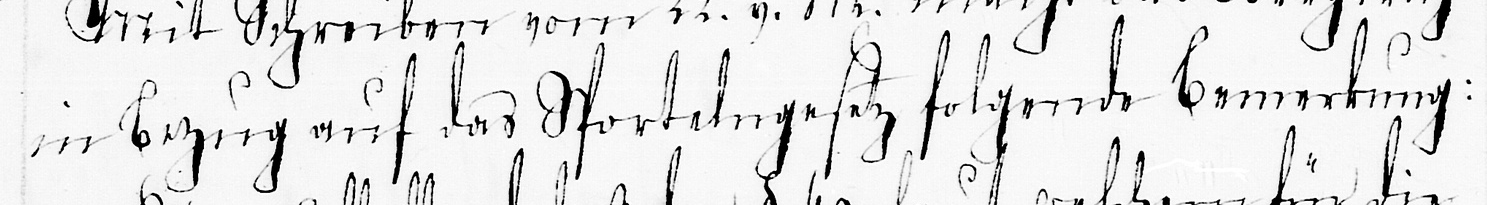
in Bezug auf das Sportelngesetz folgende Bemerkung:
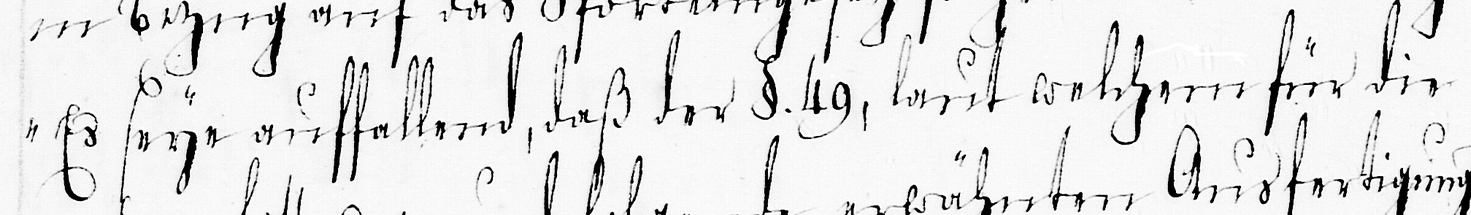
„Es seye auffallend, daß der §. 49, laut welchem für die
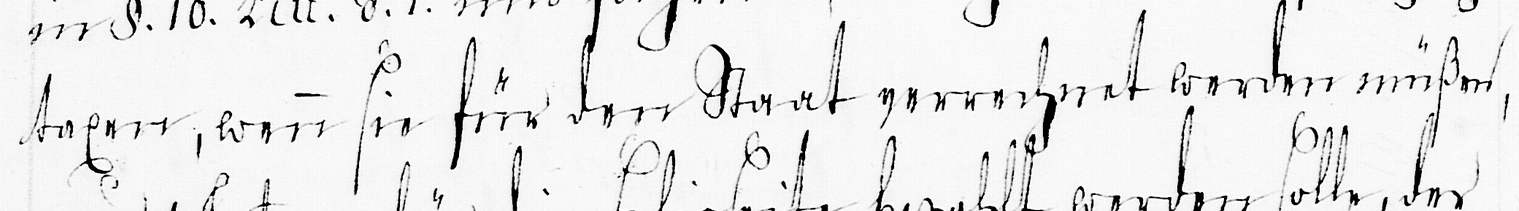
taxen, wenn sie für den Staat verrechnet werden müßen,
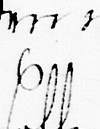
10.
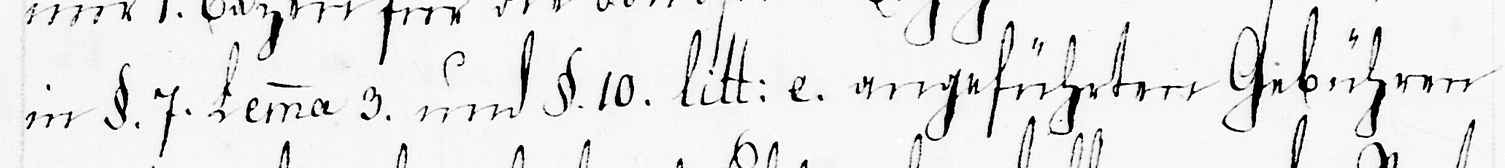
in §. 7. Lemma 3. und §. 10. litt: e. angeführten Gebühren
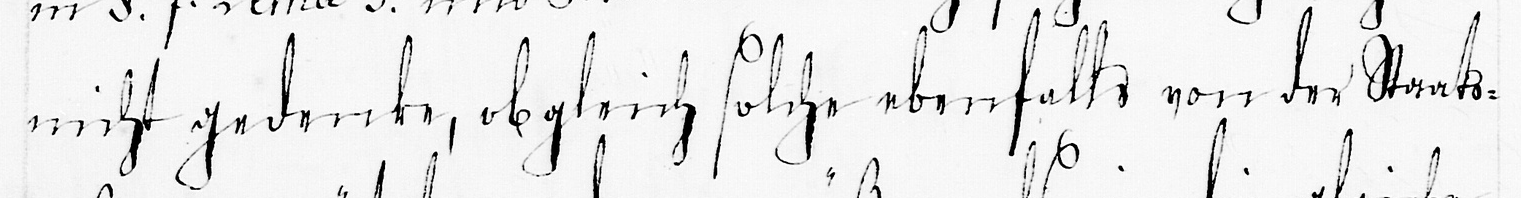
nicht gedenke, obgleich solche ebenfalls von der Staat¬
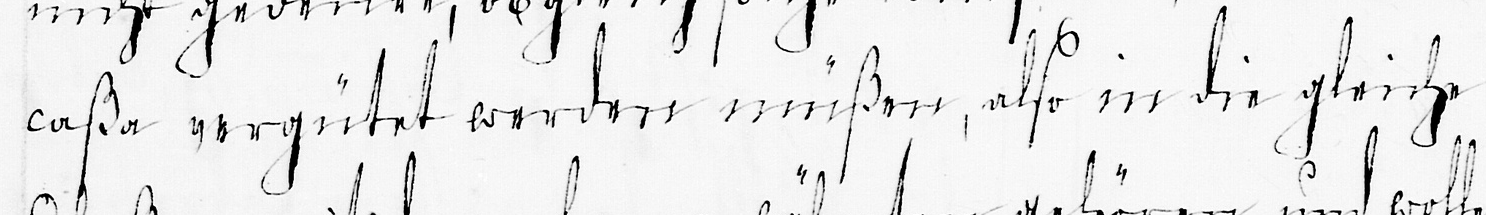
scaßa vergütet werden müßen, also in die gleiche
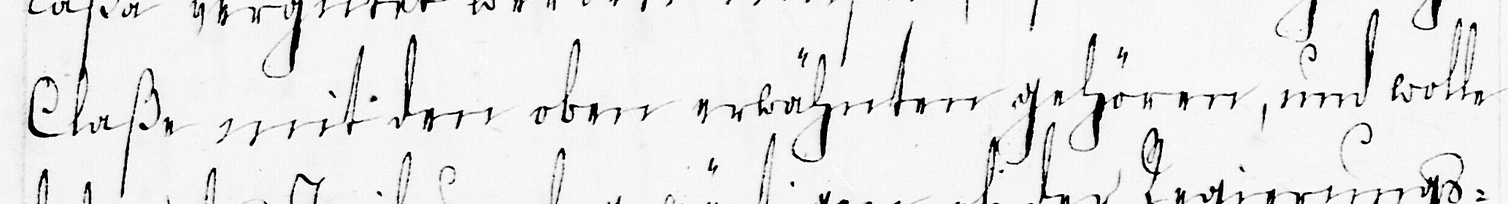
Claße mit den oben erwähnten gehören, und wolle
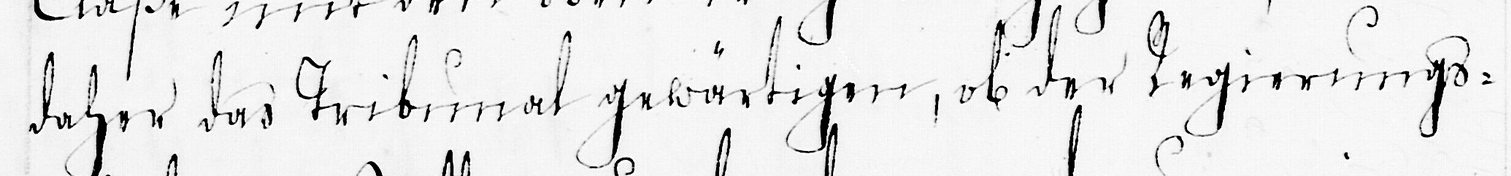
daher das Tribunal gewärtigen, ob der Regierungs¬
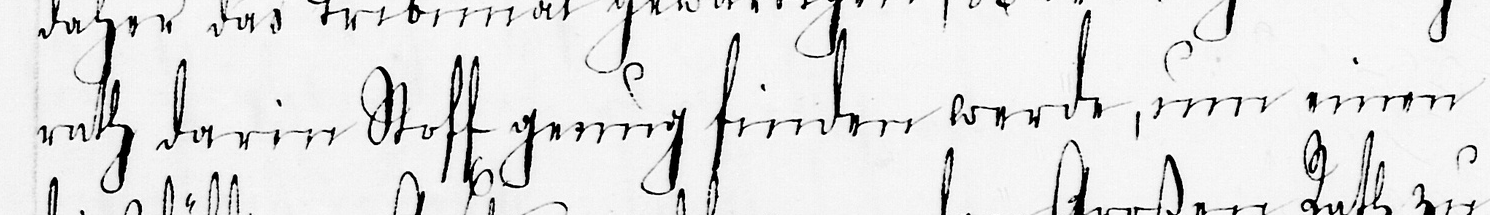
rath darin Stoff genug finden werde, um einen
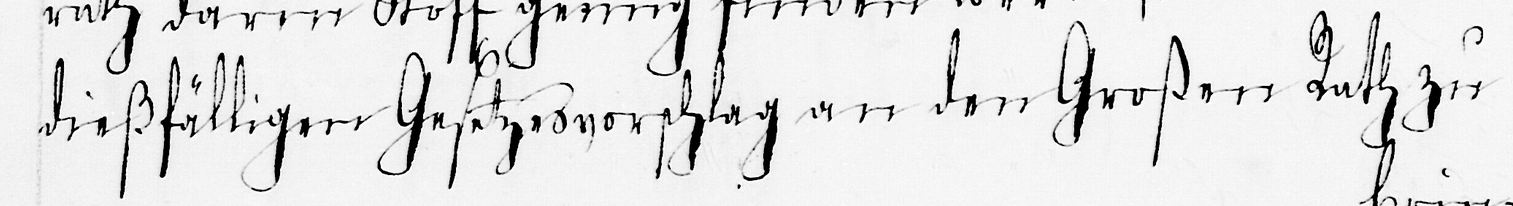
dießfälligen Gesetzesvorschlag an den Großen Rath zu
